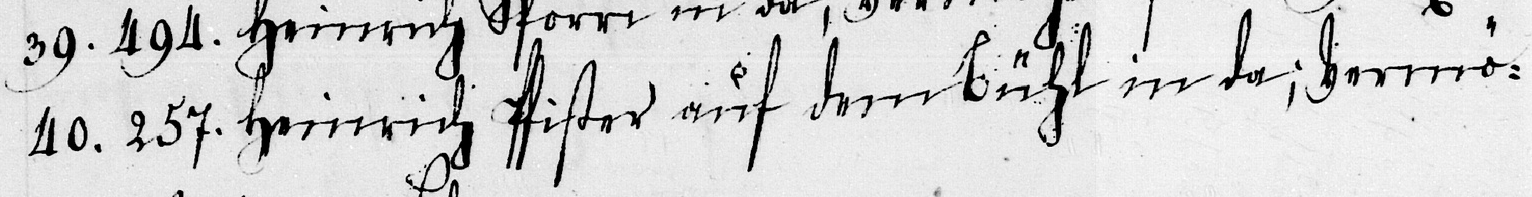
40. 257. Heinrich Pfister auf dem Bühl in da; Vermö¬
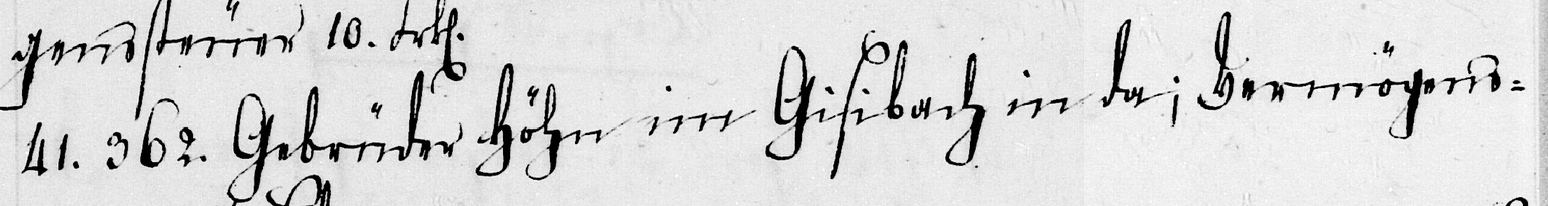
41. 362. Gebrüder Höhn im Gisibach in da; Vermögens¬
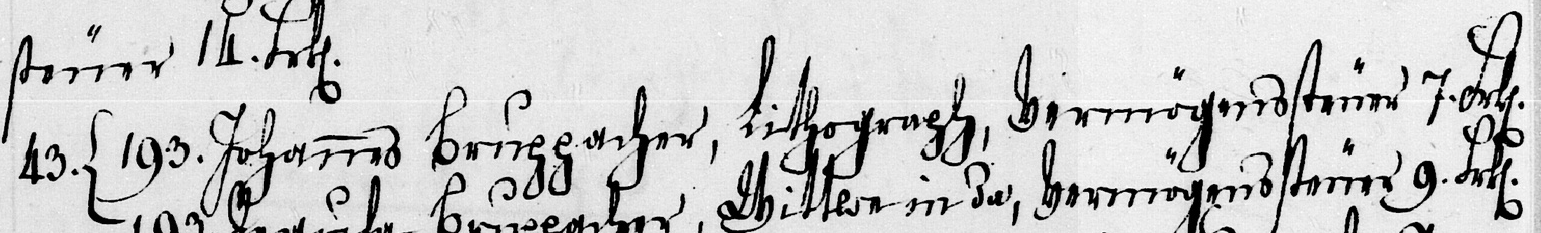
43. 193. Johannes Bruppacher, Lithograph, Vermögenssteuer 7. Fr¬
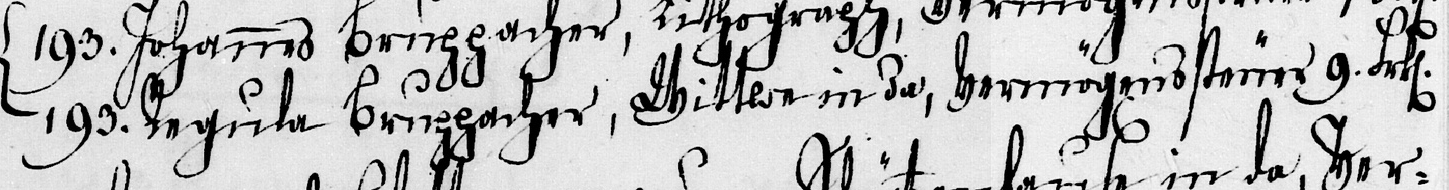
193. Regula Bruppacher, Wittwe in da, Vermögenssteuer 9. Fr¬
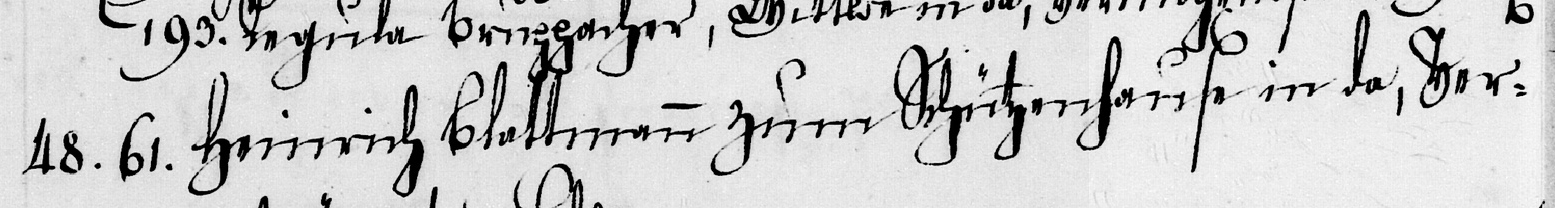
48. 61. Heinrich Blattmann zum Schützenhause in da, Ver¬
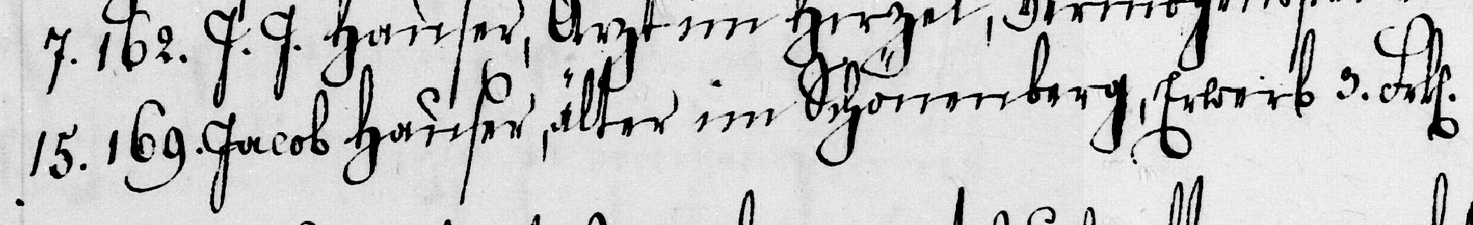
15. 169. Jacob Hauser, älter im Schönenberg, Erwerb 3. Fr¬
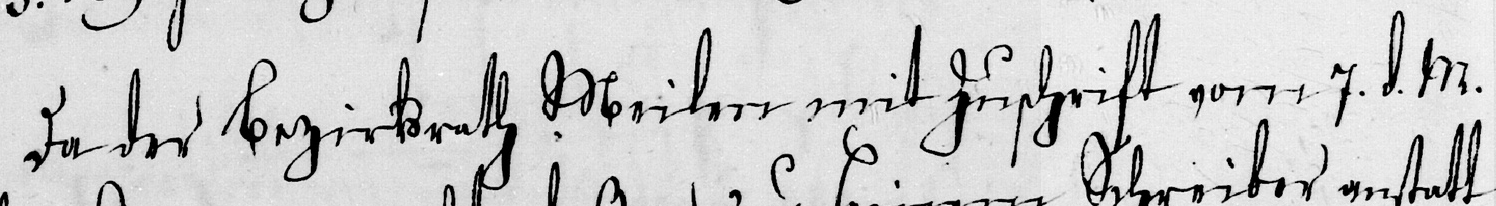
Da der Bezirksrath Meilen mit Zuschrift vom 7. d. M.
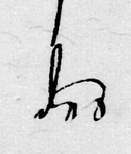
er
